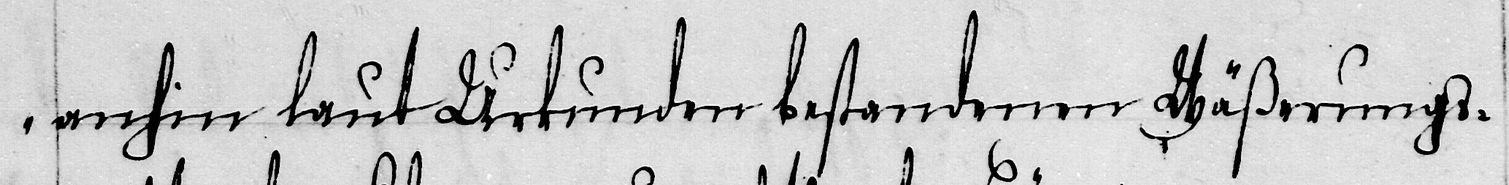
anhin laut Urkunden bestandenen Wäßerungs¬
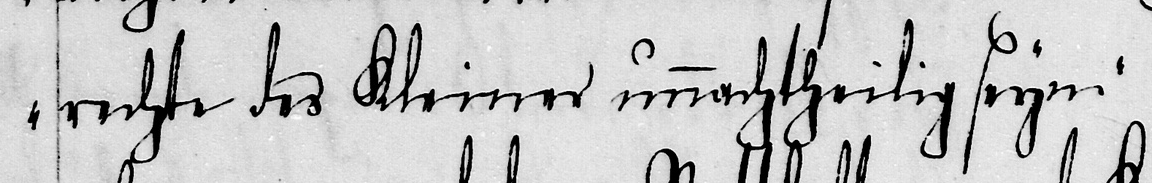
rechte des Kleiner unnachtheilig seyn.“
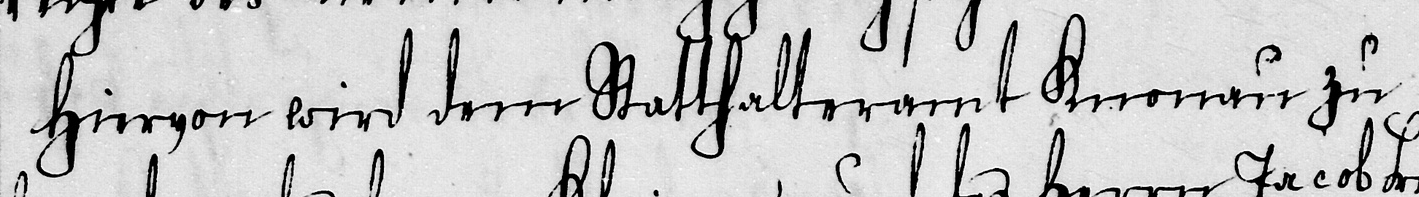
Hiervon wird dem Statthalteramt Knonau zu
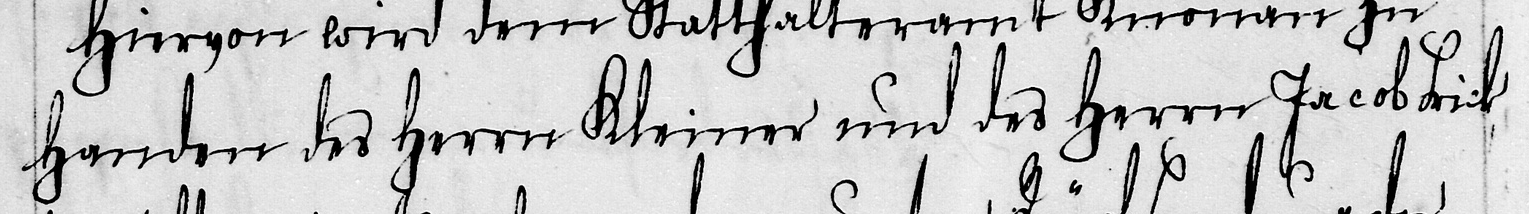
Handen des Herrn Kleiner und des Herrn Jacob Fric¬
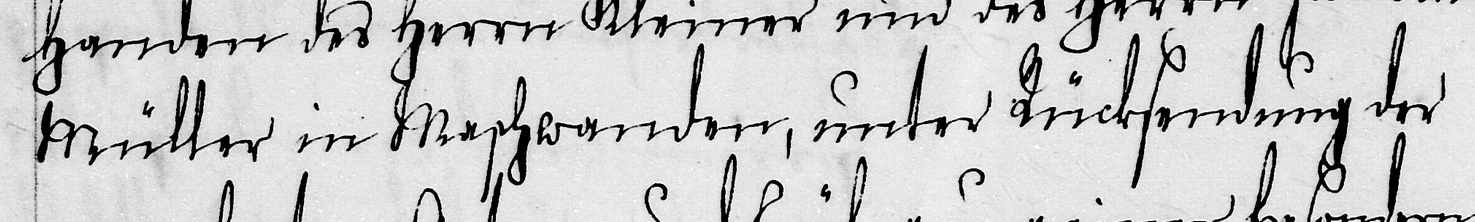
Müller in Maschwanden, unter Rücksendung der
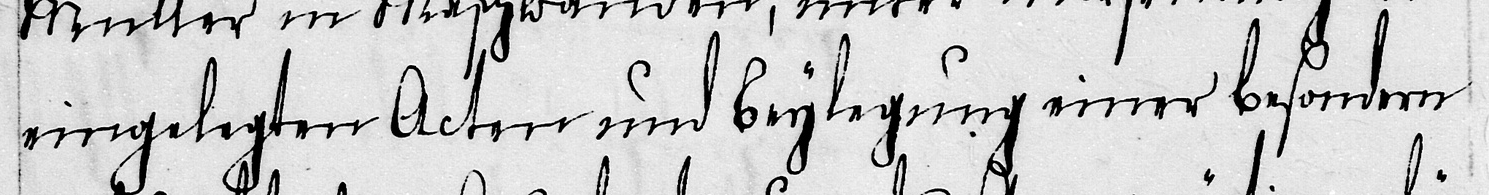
eingelegten Acten und Beylegung einer besondern
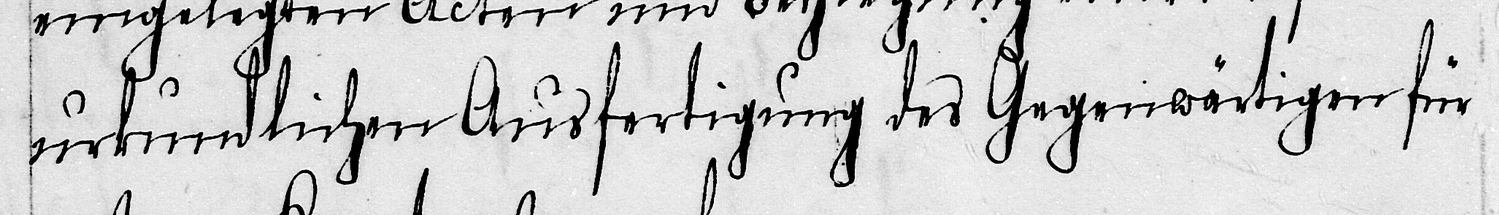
urkundlichen Ausfertigung des Gegenwärtigen für
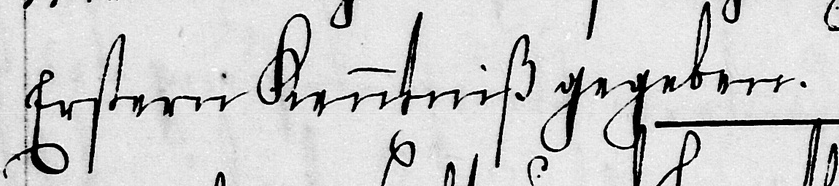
Erstern Kenntniß gegeben.
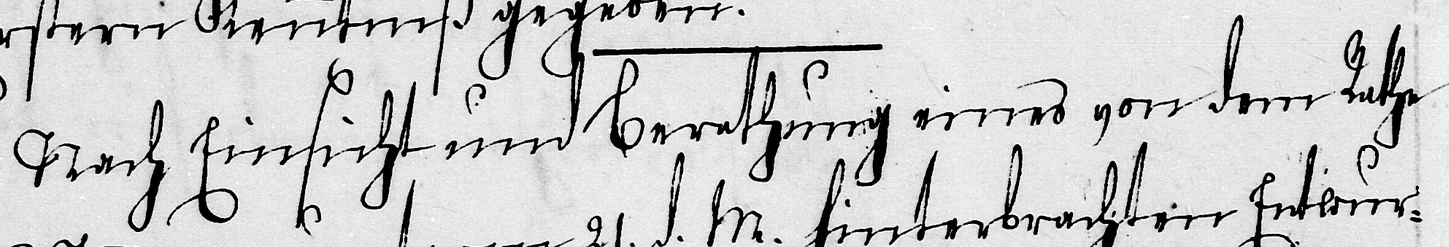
Nach Einsicht und Berathung eines von dem Rathe
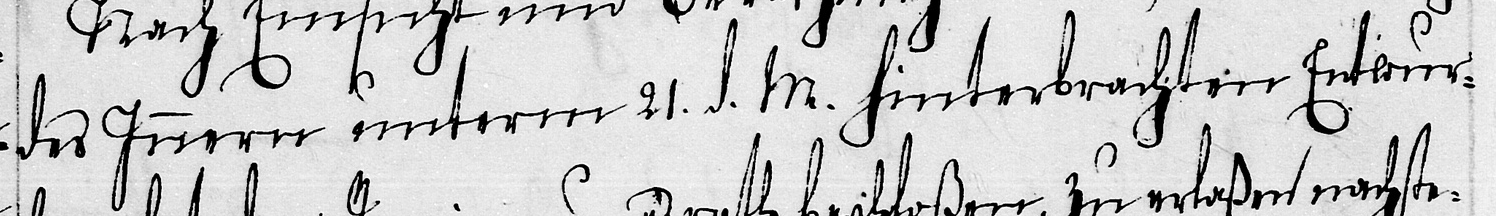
des Innern unterm 21. d. M. hinterbrachten Entwur¬
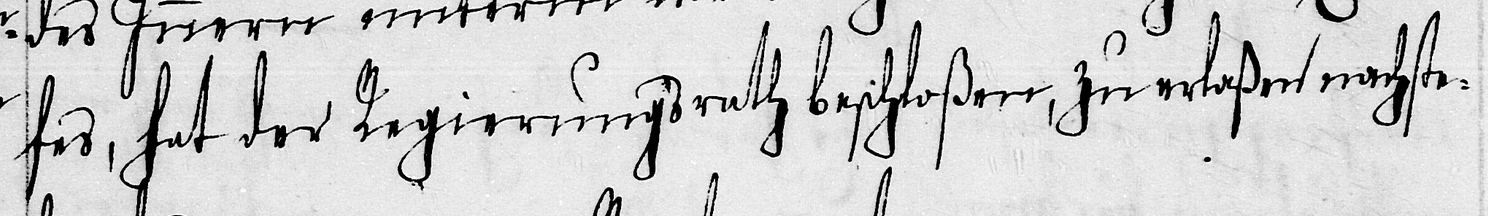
fes, hat der Regierungsrath beschloßen, zu erlaßen nachst¬
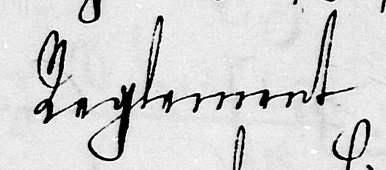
Reglement
